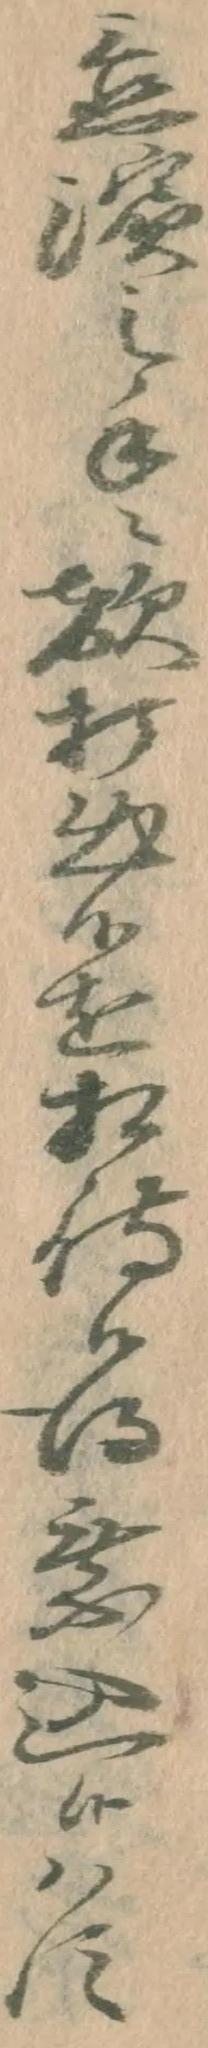置浜之手に敵打出候を相待候得乗込候は須
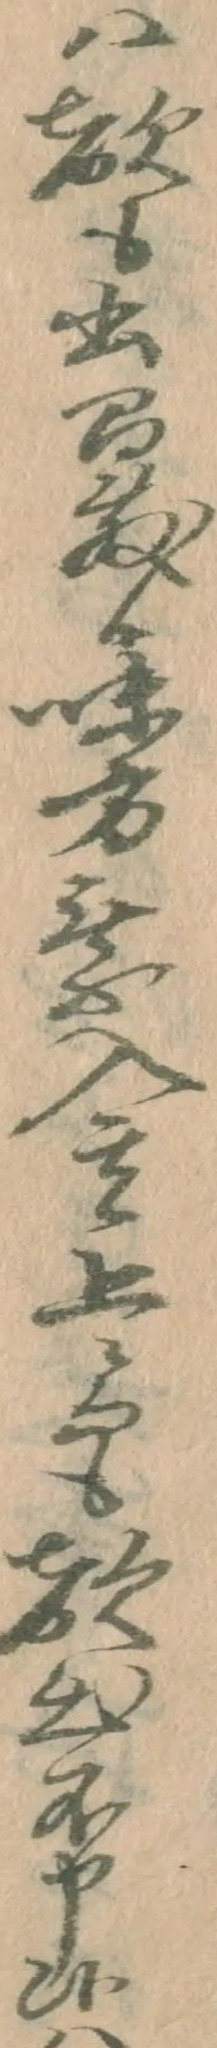は敵も出間敷候味方乗入其上に而も敵出不申候は
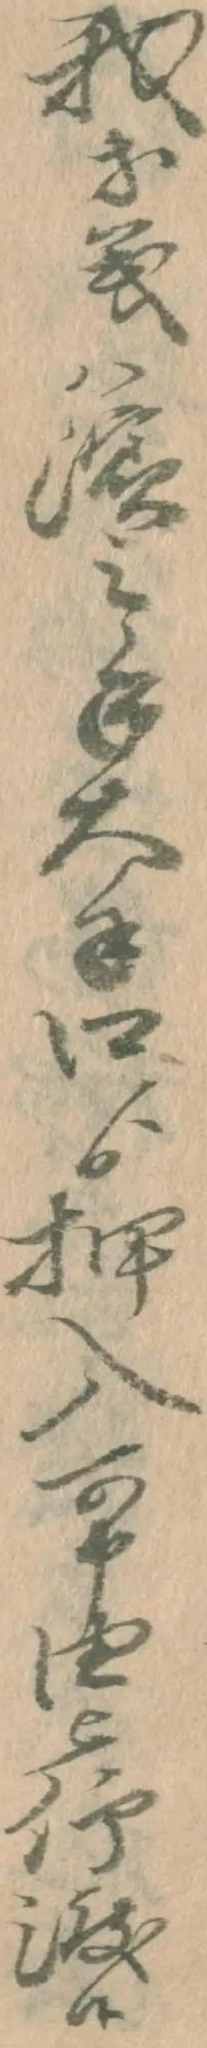我等義は浜之手大手口ゟ押入可申由被仰渡候

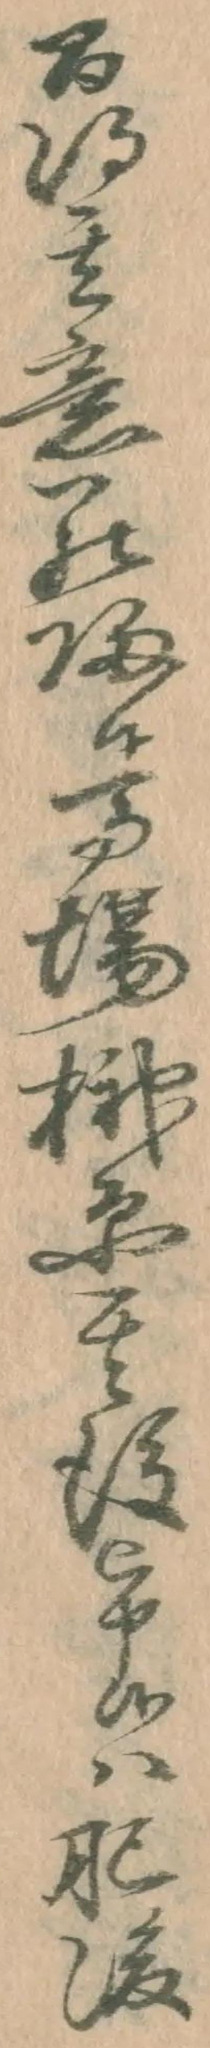間得其意罷帰候馬場榊原其後被申候は肥後
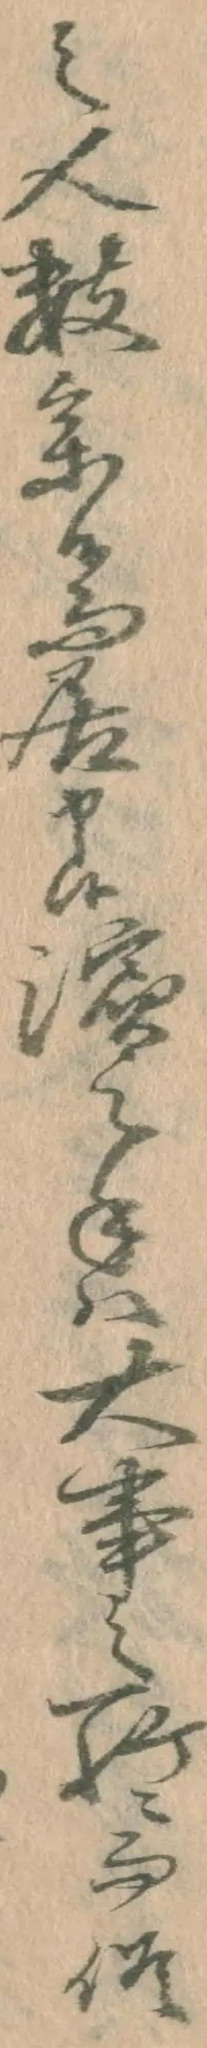之人数参候而居申候浜之手は大事之所に而候
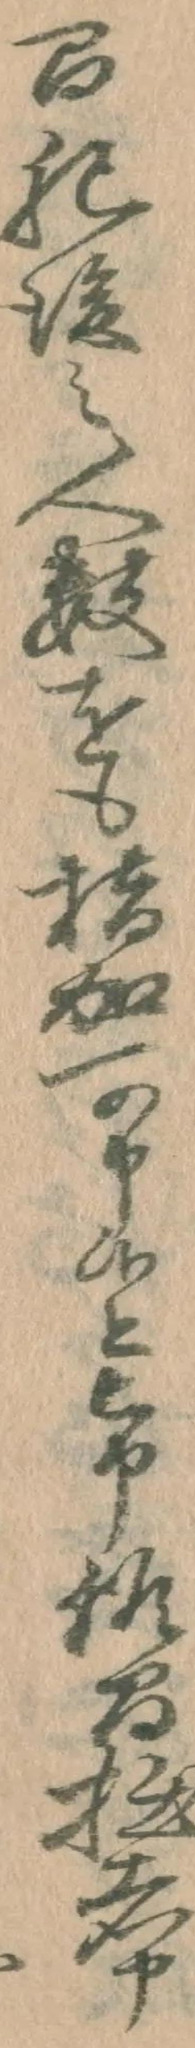間肥後之人数をも指加可申候と被申候間拙者申
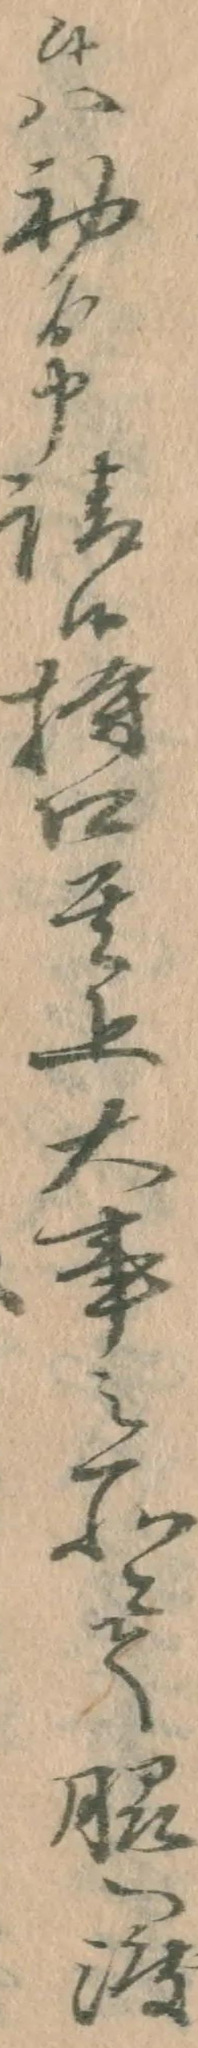候は初ゟ申請候持口其上大事之所とて脇へ渡
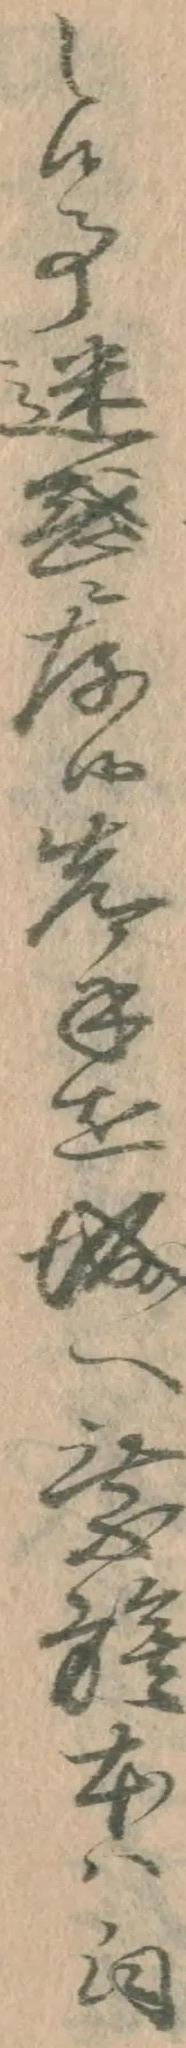し候事迷惑に存候先手を城へ乗旗本は自
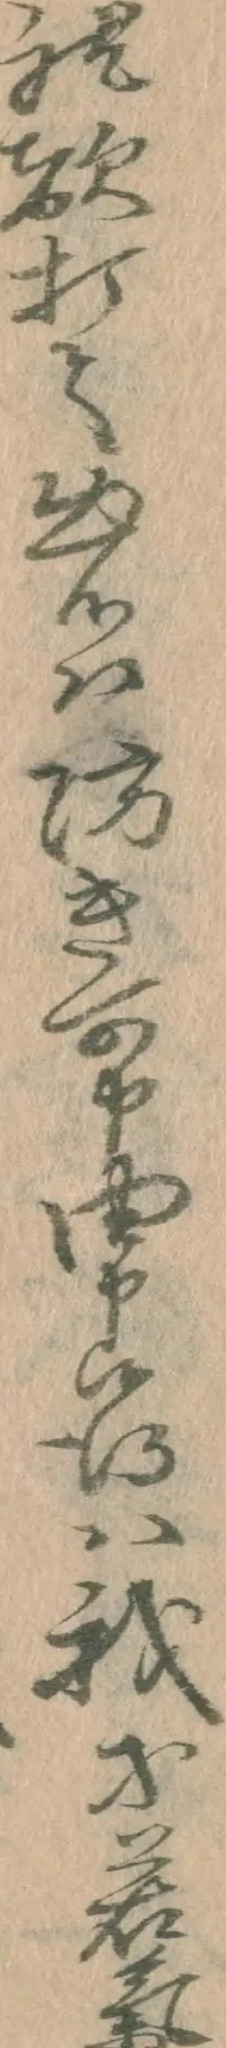然敵打て出候は防き可申由申候得は我等若気
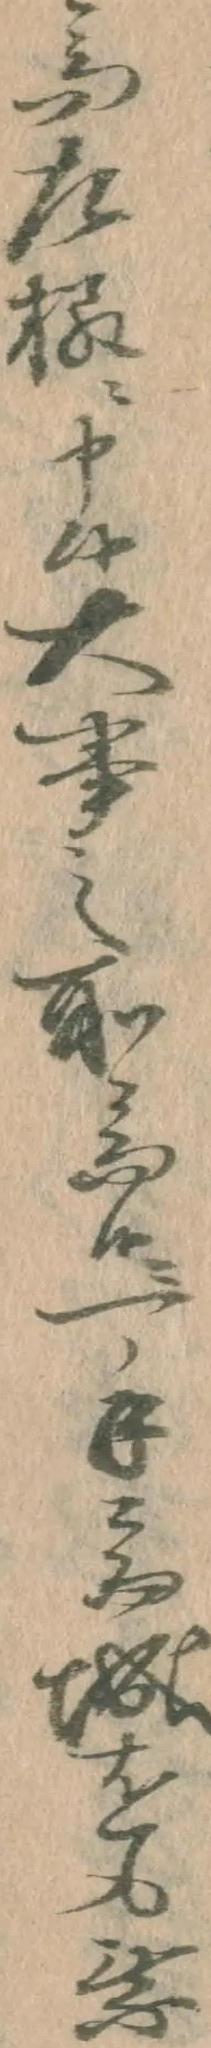に而左様に申候大事之所に而候に一手に而城をも乗
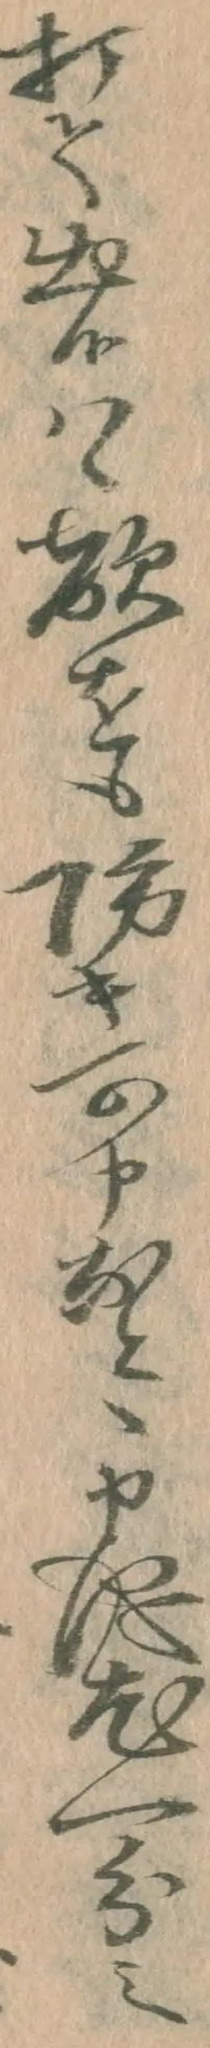打て出候はゝ敵をも防き可申なとゝ申儀尤一分之
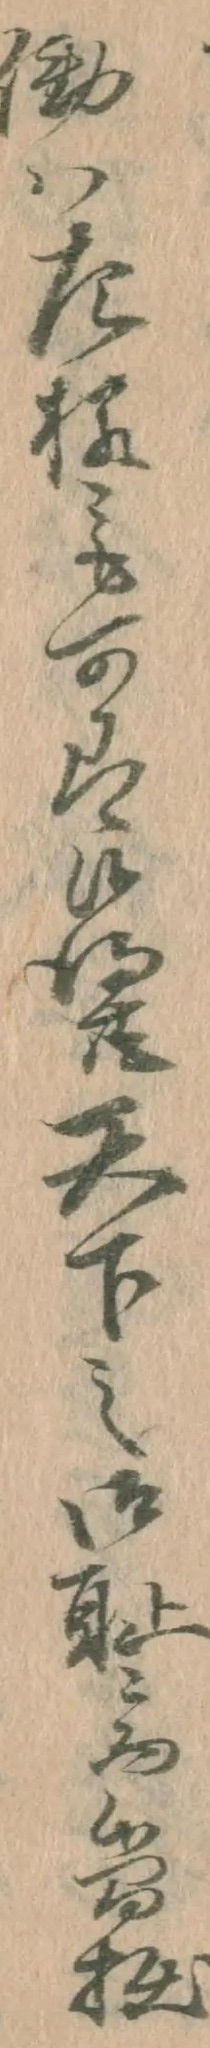働は左様にも可望候得共天下之御耻に而候間拙
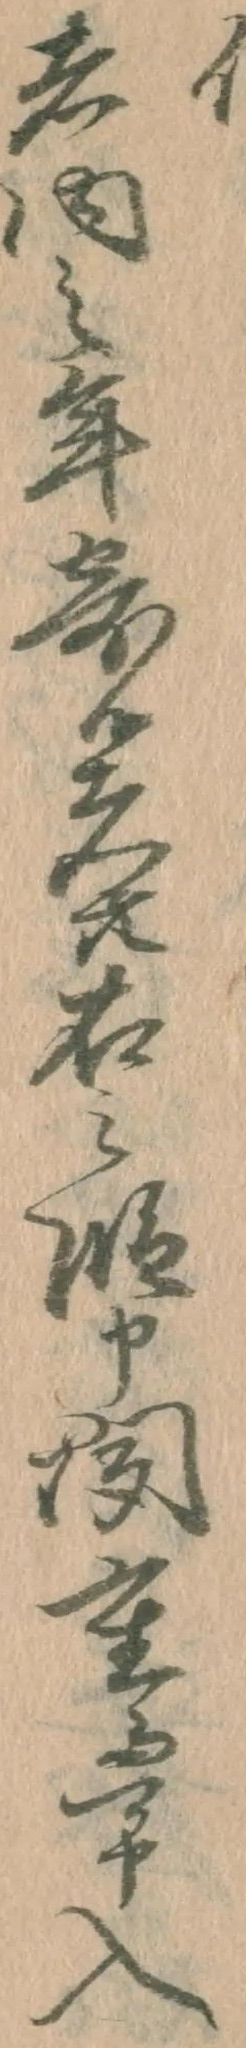者内之年寄候者共右之段申聞重而可申入
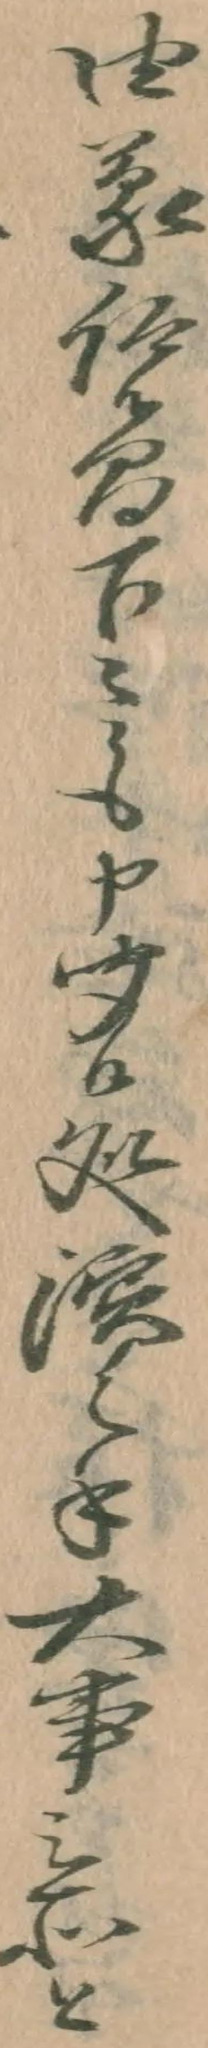由承仰候間下々にも申聞候処浜之手大事之所と
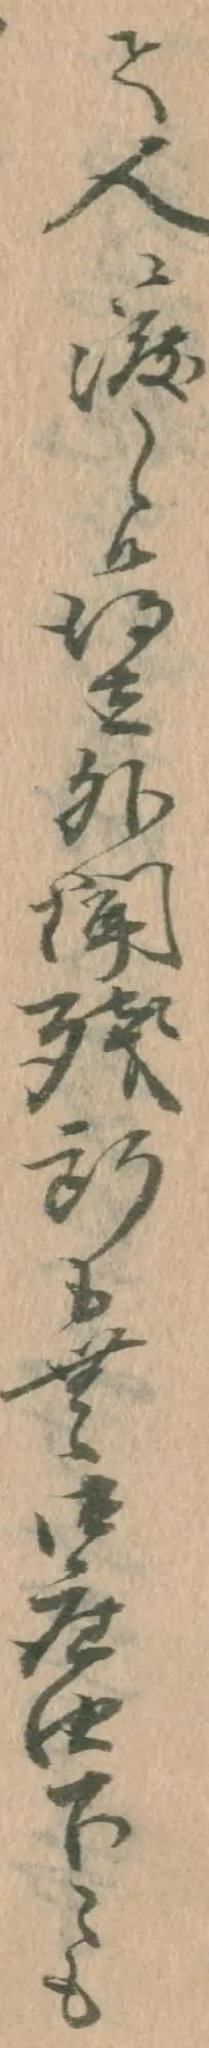て人に渡し候得者外聞残所も無御座由下々も
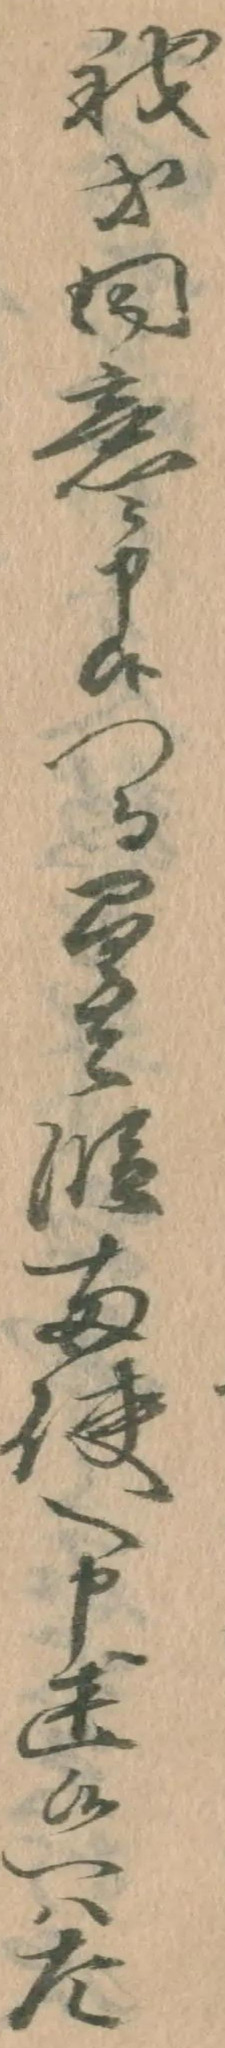我等同意に申候つる間其段両使へ申述候へは左
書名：切支丹御退治記 49巻. [5]
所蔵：国立国会図書館 National Diet Library, JAPAN
